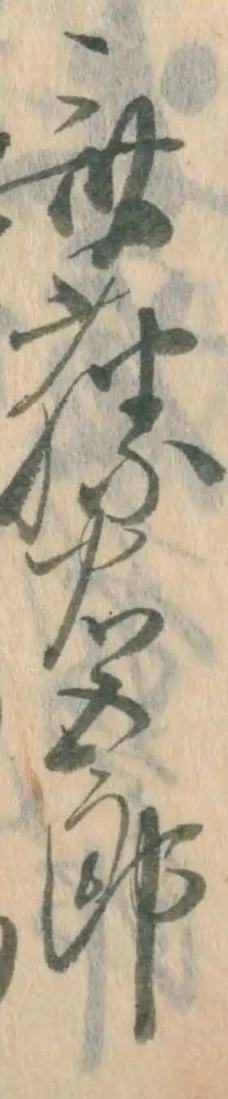斎藤右五郎
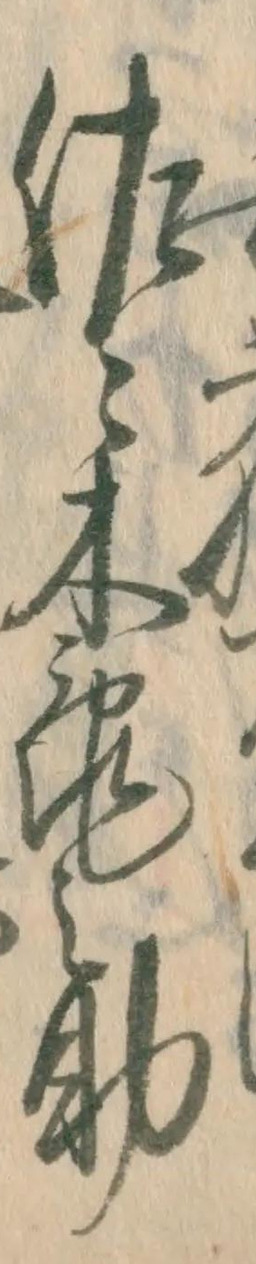佐〻木亀之助
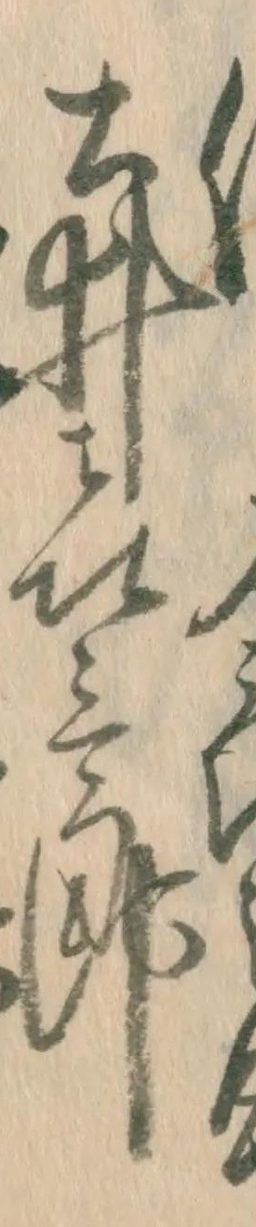大井喜三郎
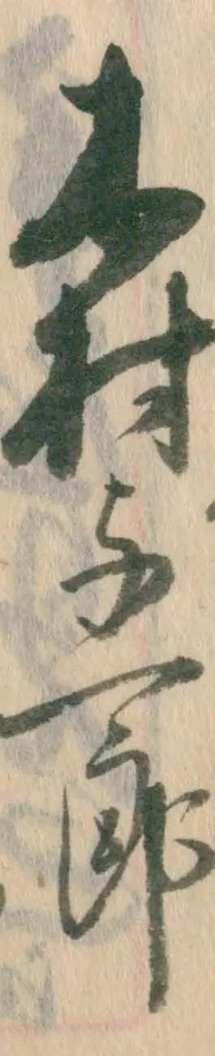木村与一郎
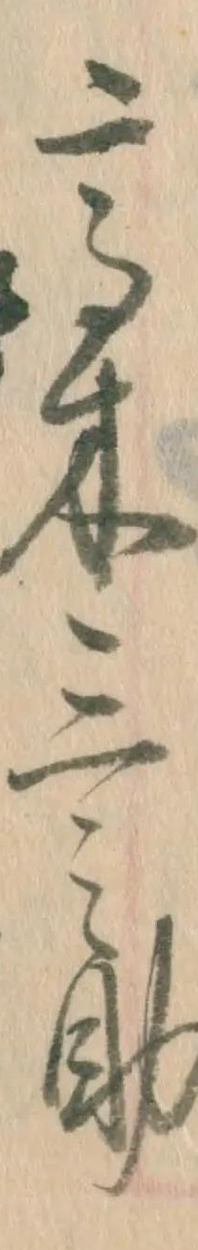高木三之助
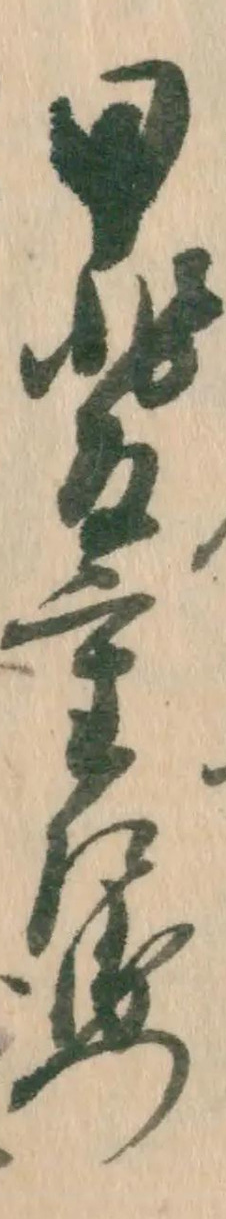甲斐重左衛門
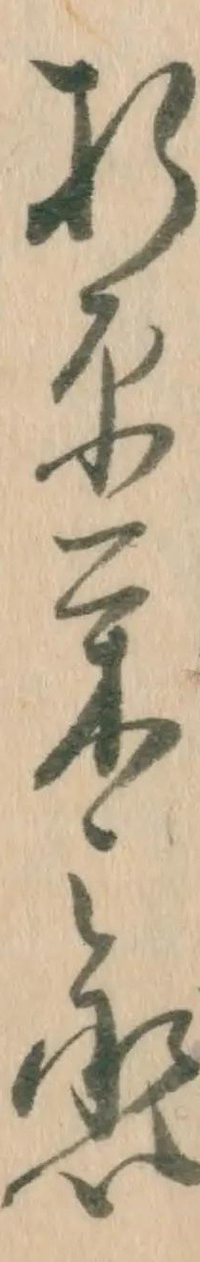折原栄之丞
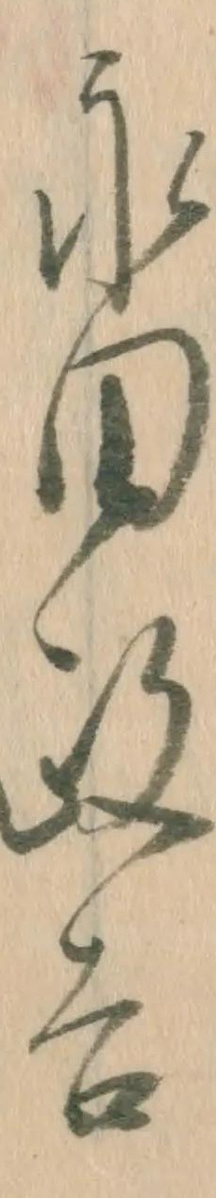永田政吉
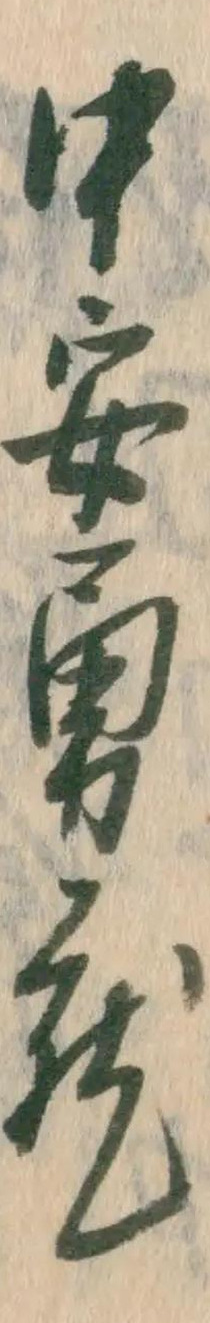中安勇蔵
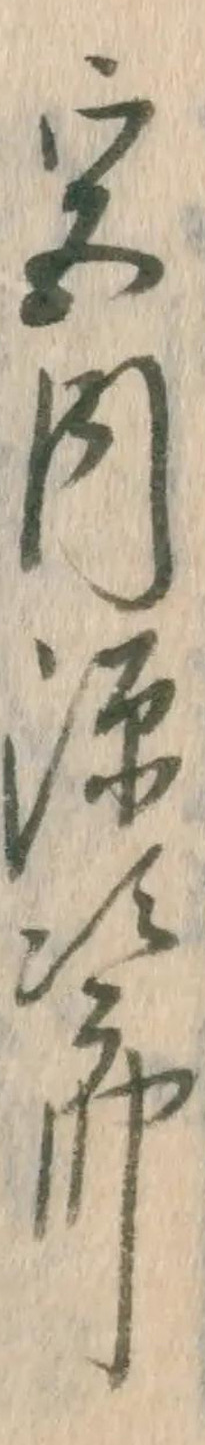宮内源次郎
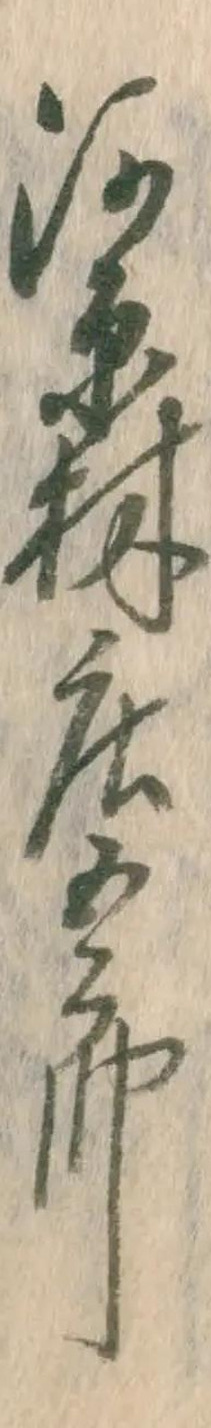河東村庄五郎
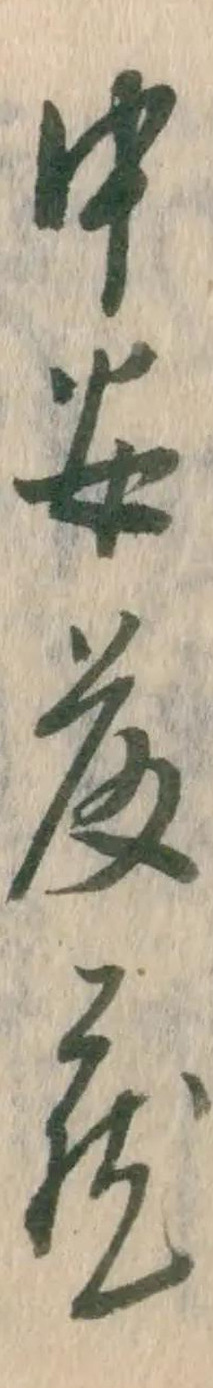中安藤蔵
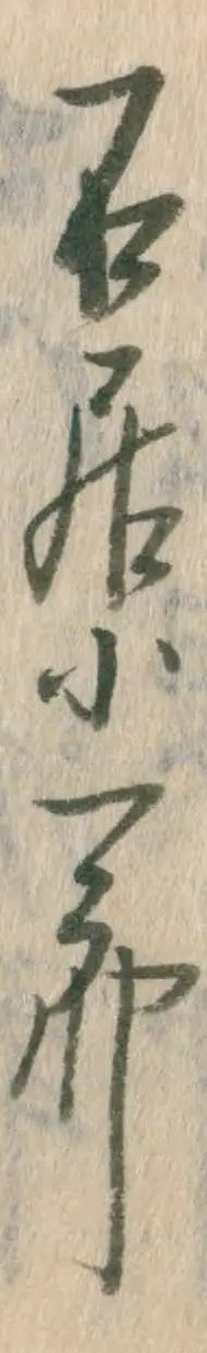石居小一郎
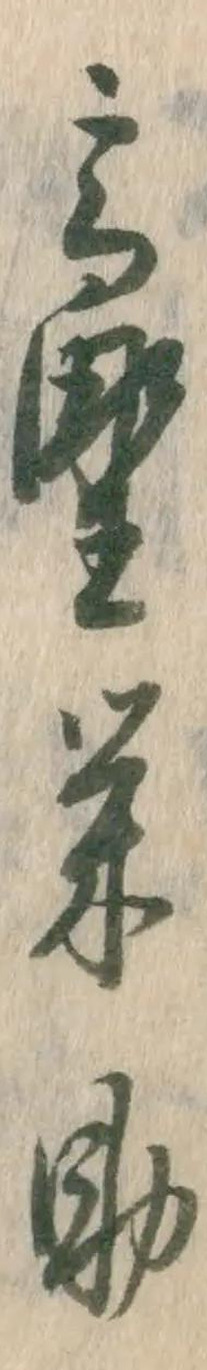高野米助
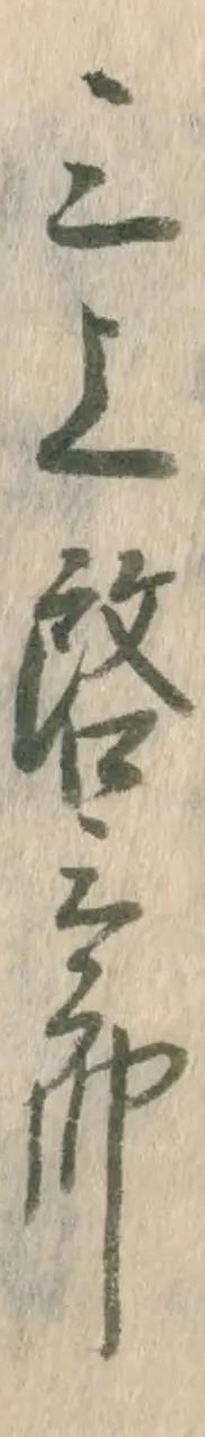三上啓三郎
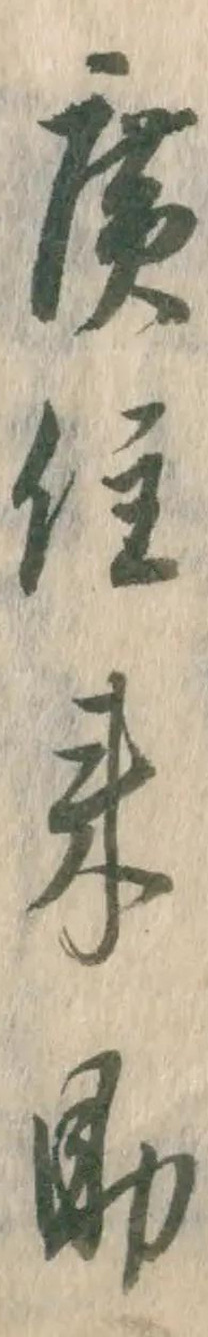広住来助
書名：七十冊物類集 71巻. [44] 四十三 牢屋敷御普請御修覆地震ニ付骨折候牢屋掛御褒美之部
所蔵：国立国会図書館 National Diet Library, JAPAN
